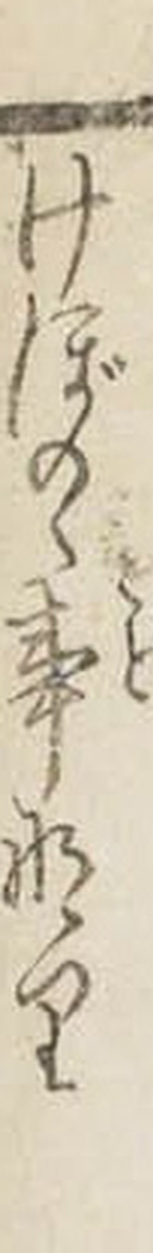けぼのゝ事なり
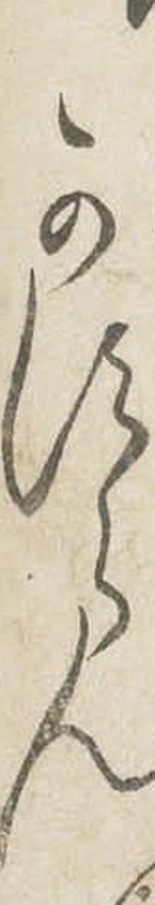かすらん
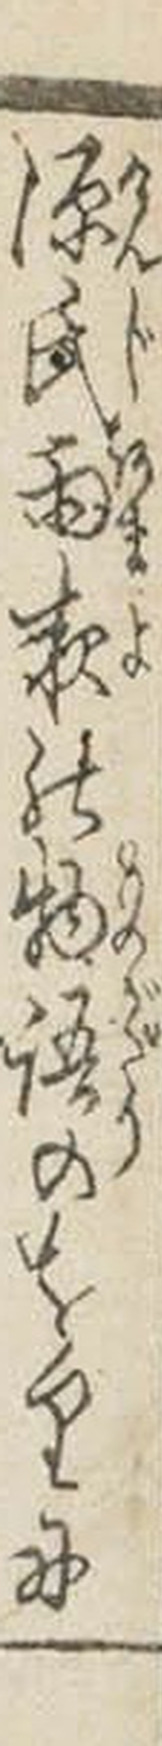源氏雨夜の物語のをりに
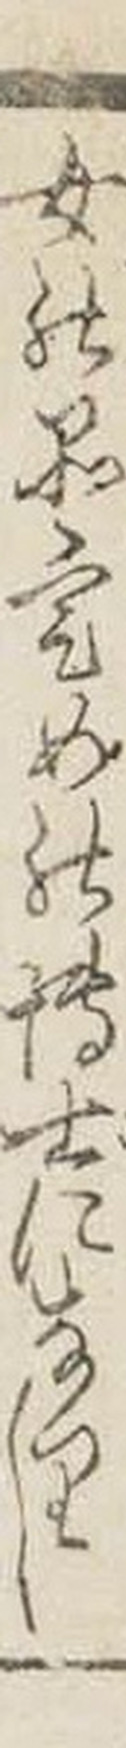女の品定めの博士になりし
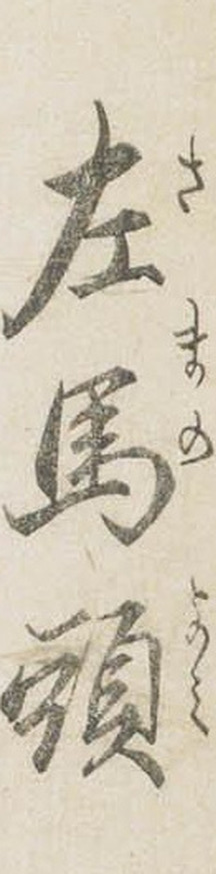左馬頭
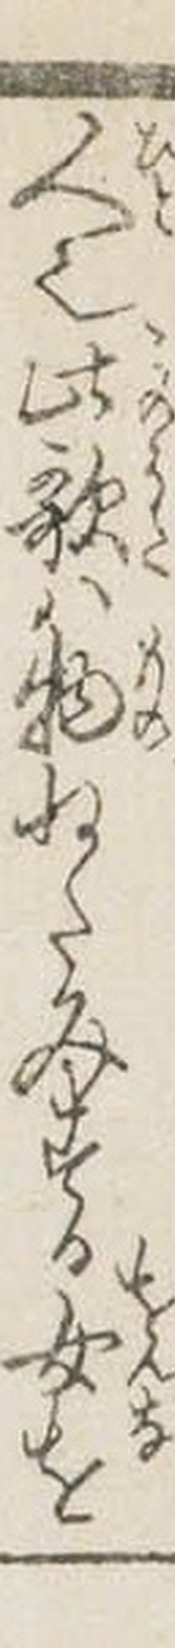人也此歌は物ねたみする女を
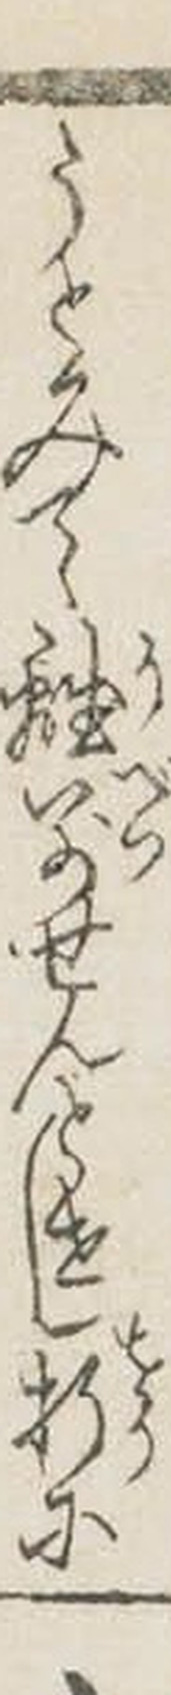うとみて離別せんとせし折に
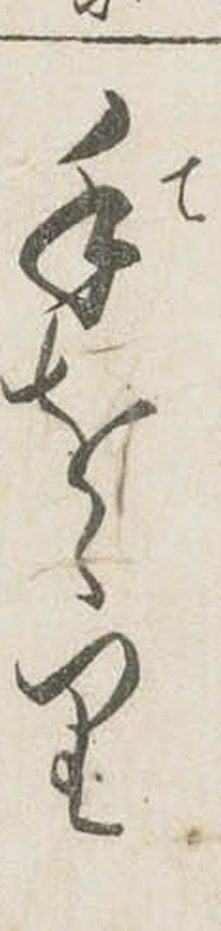手をゝり
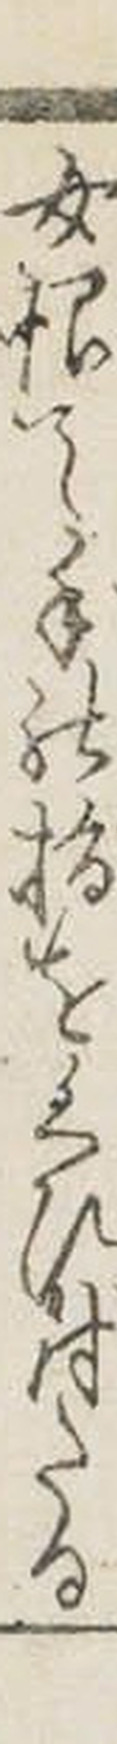女恨て手の指をくひ付たる
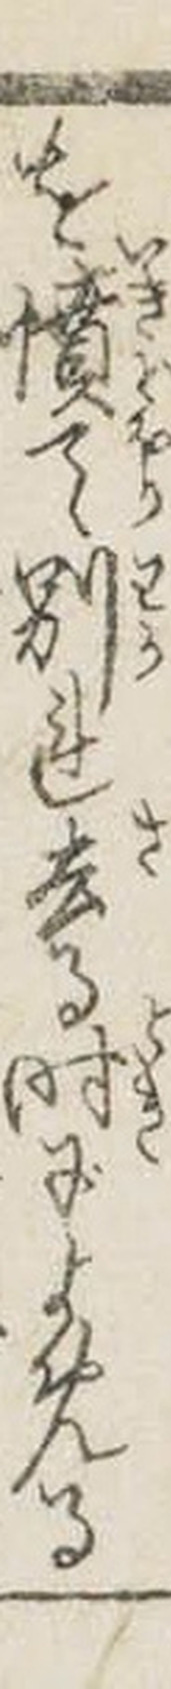を憤て別れ去る時によめる
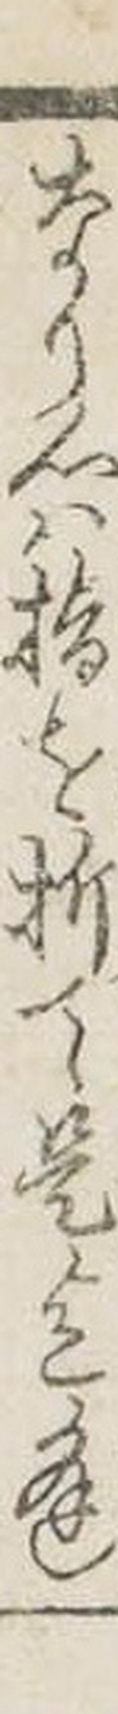なり心は指を折て是迄逢
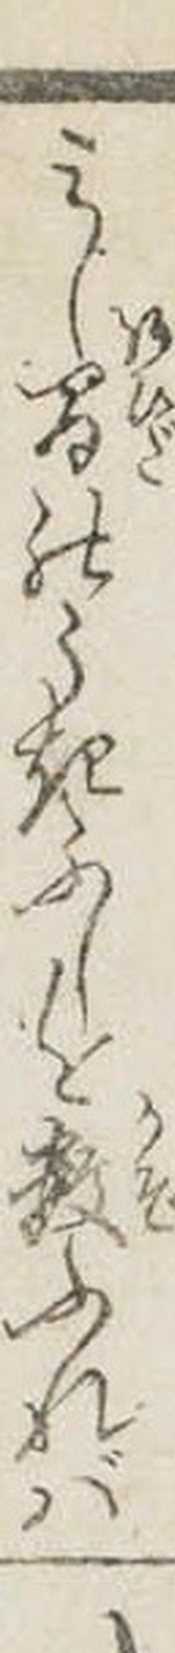みし間のうきふしを数ふれば
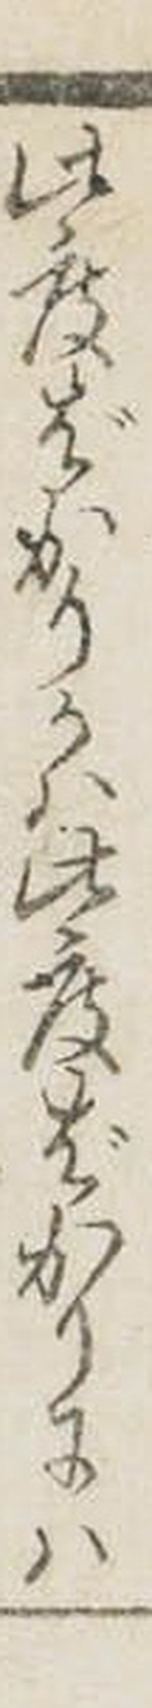此度ばかりかは此度ばかりには
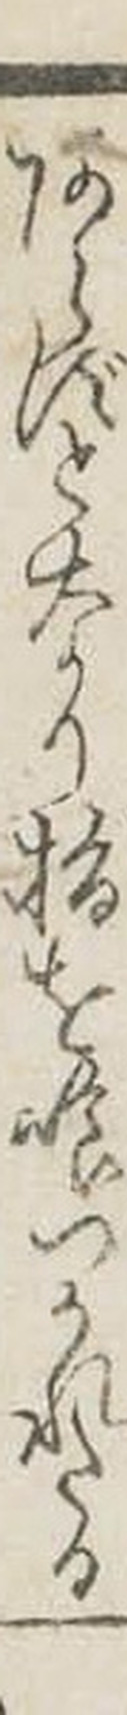あらずとなり指を喰つかれたる
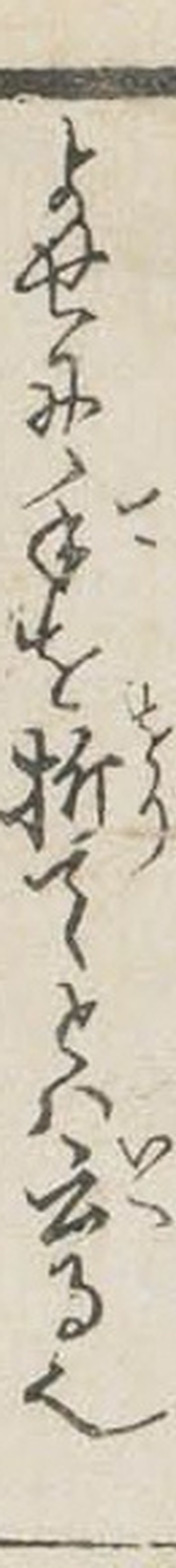よせに手を折てとは云る也
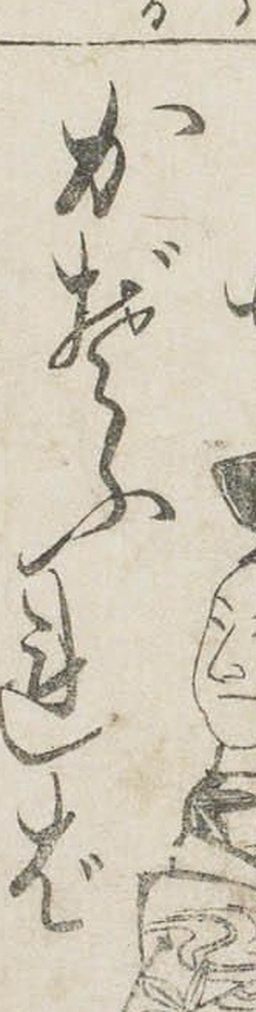かぞふれば
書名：源氏百人一首
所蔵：東京学芸大学教育コンテンツアーカイブ
